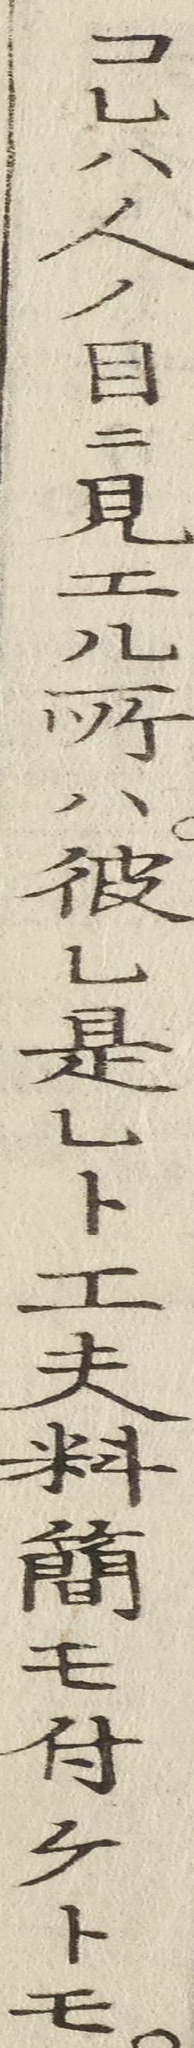コレハ人ノ目ニ見エル所ハ。彼レ是レト工夫料簡モ付ケトモ。
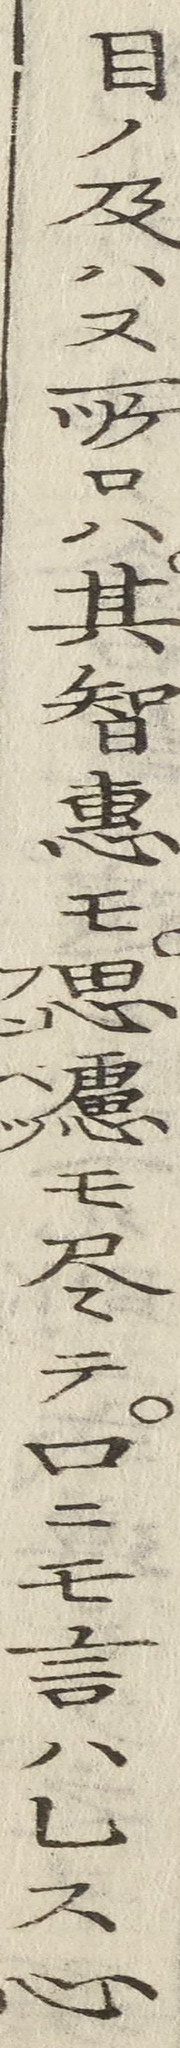目ノ及ハス所ロハ。其智恵モ。思慮モ尽テ。口ニモ言ハレス心
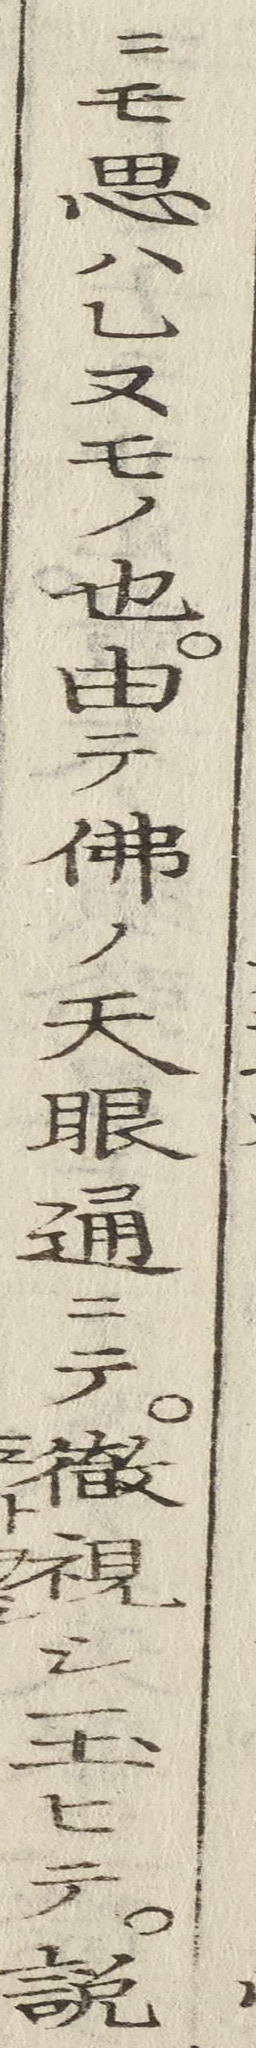ニモ思ハレヌモノ也。由テ仏ノ天眼通ニテ。徹視シ玉ヒテ。説
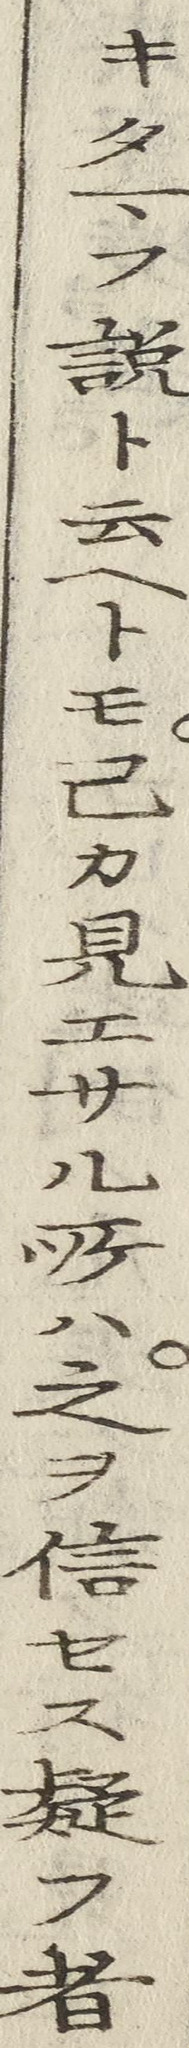キタマフ説ト云ヘトモ。己カ見エサル所ハ。之ヲ信セス疑フ者
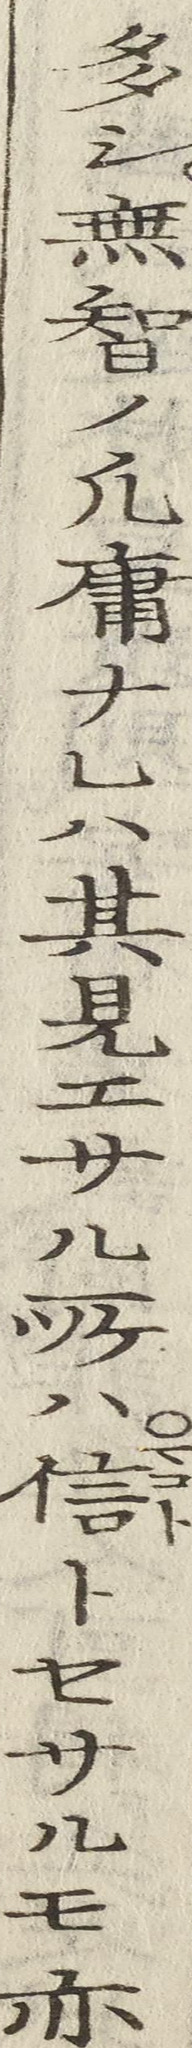多シ。無智ノ凡庸ナレハ其見エサル所ハ。信トセサルモ亦
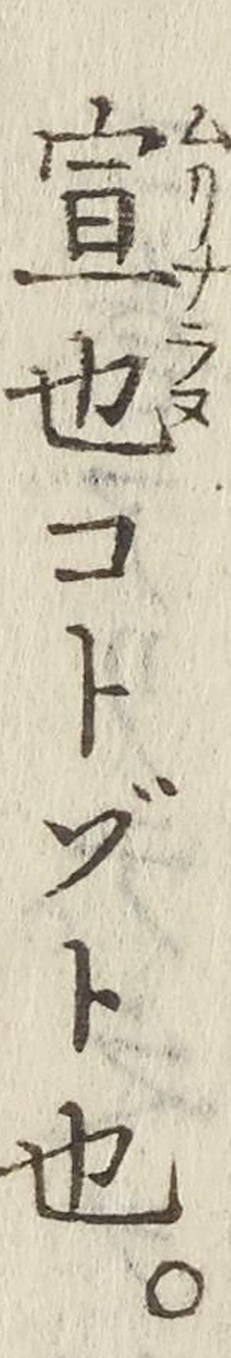宣也コトゾト也。
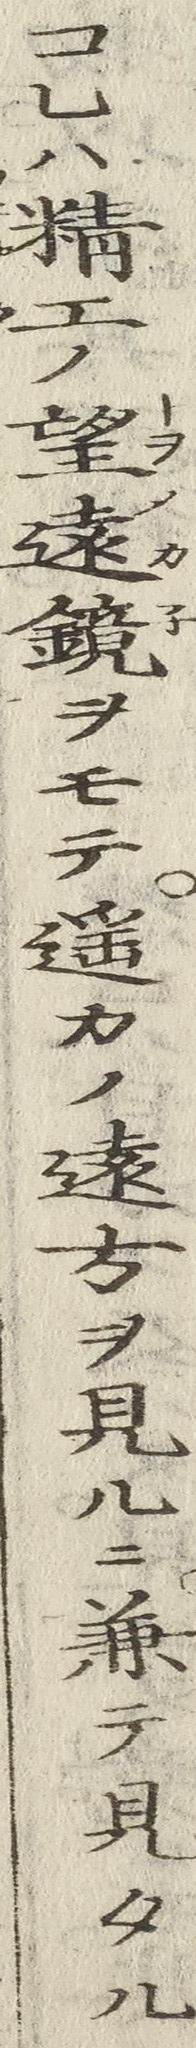コレハ精工ノ望遠鏡ヲモテ。遙カノ遠方ヲ見ル二。兼テ見タル
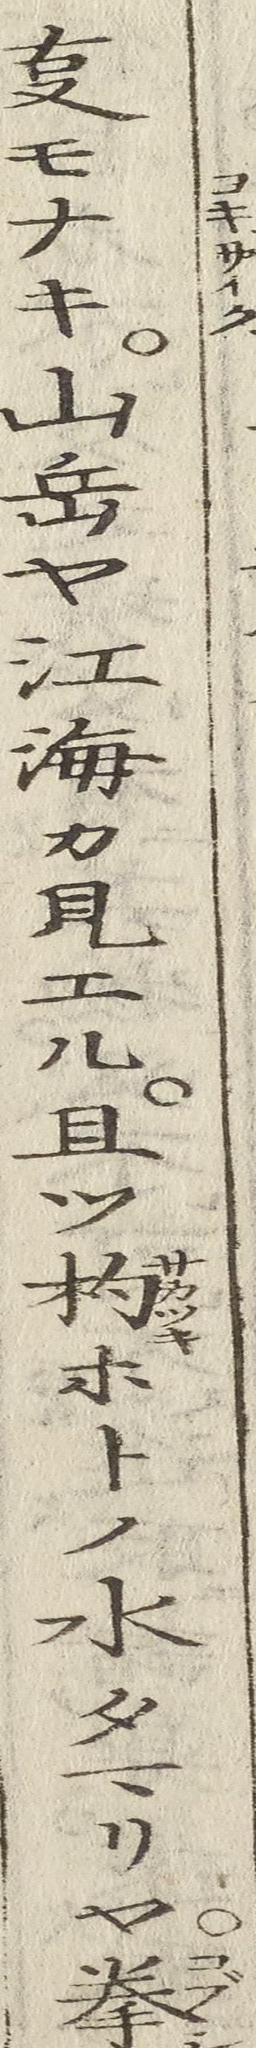事モナキ。山岳ヤ江海カ見エル。且ツ杓ホトノ水タマリヤ。拳
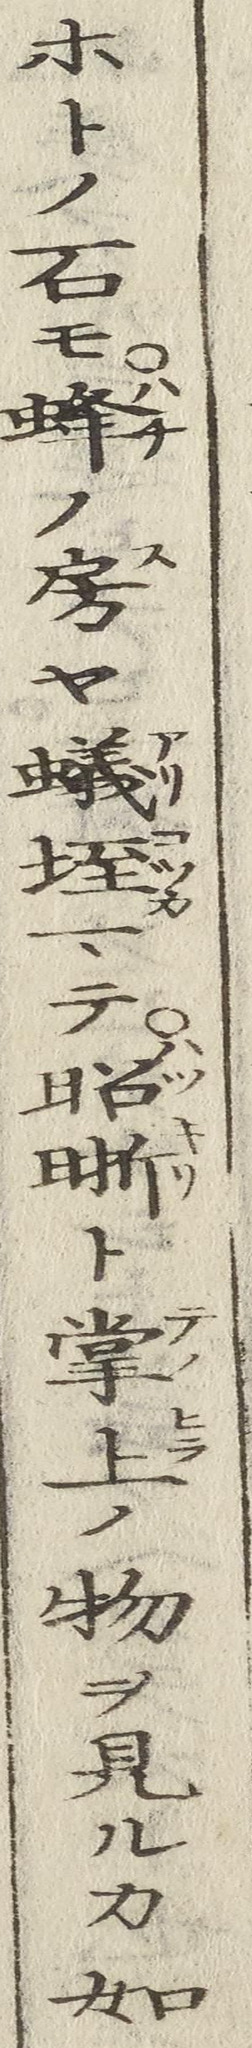ホトノ石モ。蜂ノ房ヤ蟻垤マテ。昭晰ト掌上ノ物ヲ見ルカ如
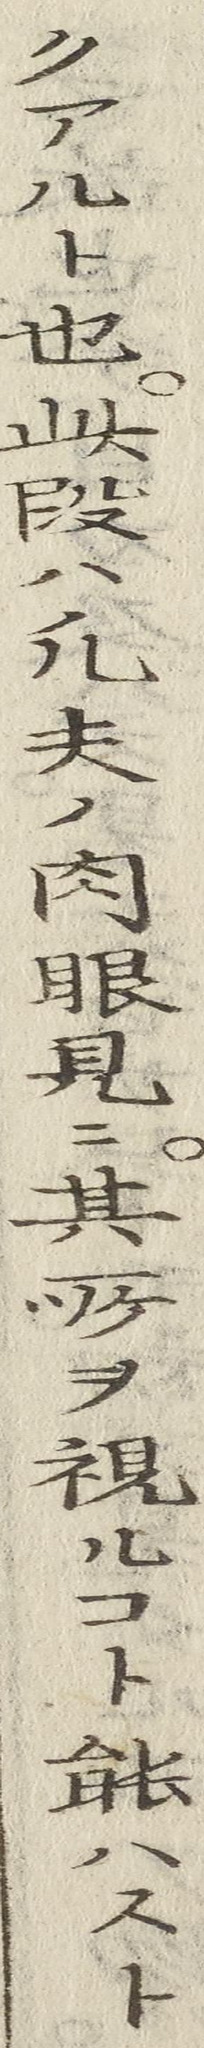クアルト也。此段ハ凡夫ノ肉眼見二。其所ヲ視ルコト能ハスト
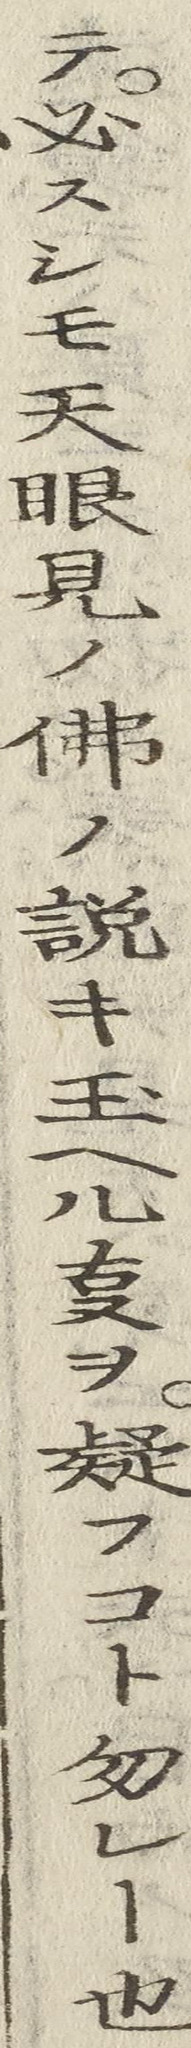テ。必スシモ天眼見ノ仏ノ説キ玉ヘル事ヲ。疑フコト勿レト也。
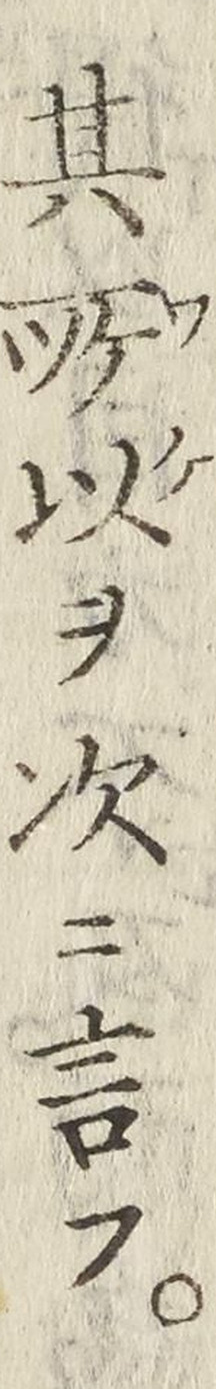其所以ヲ次ニ言フ。
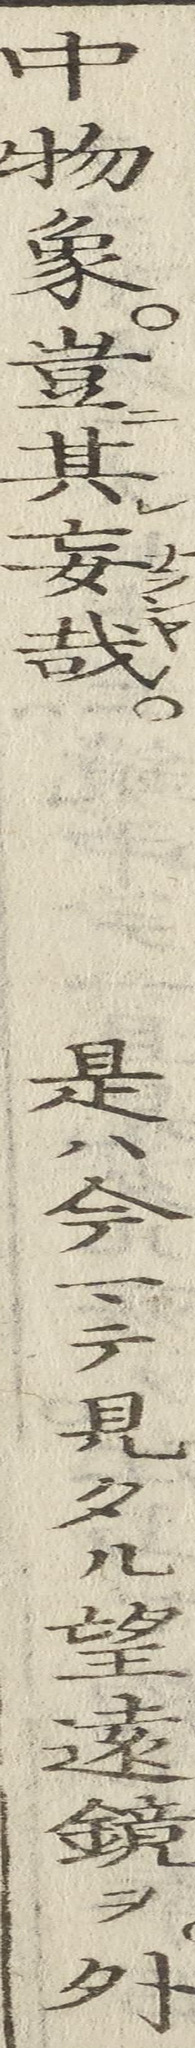中物象。豈二其妄哉。是ハ今マテ見タル望遠鏡ヲ。外
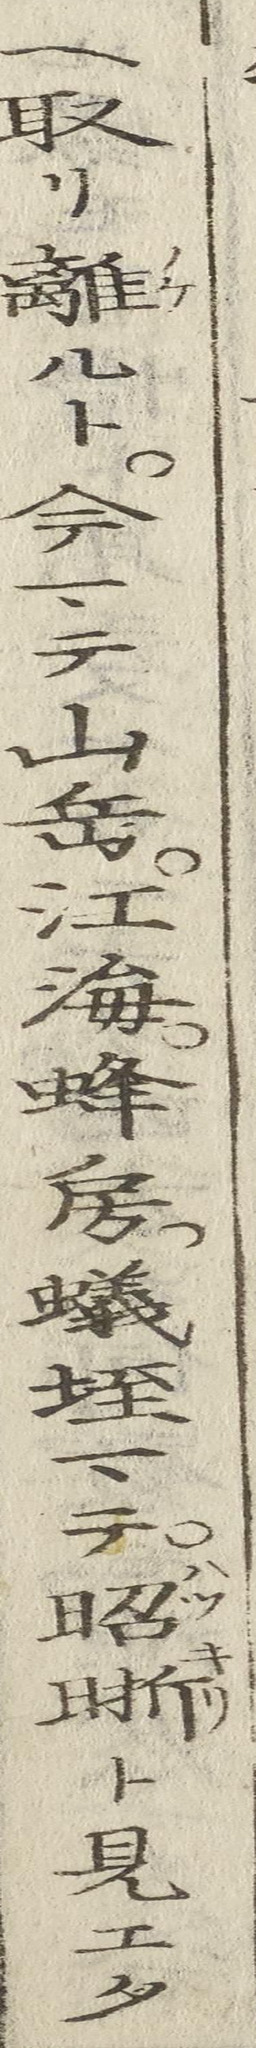ヘ取リ離ルト。今マテ山岳。江海。蜂房。蟻垤マテ。昭晰ト見エタ

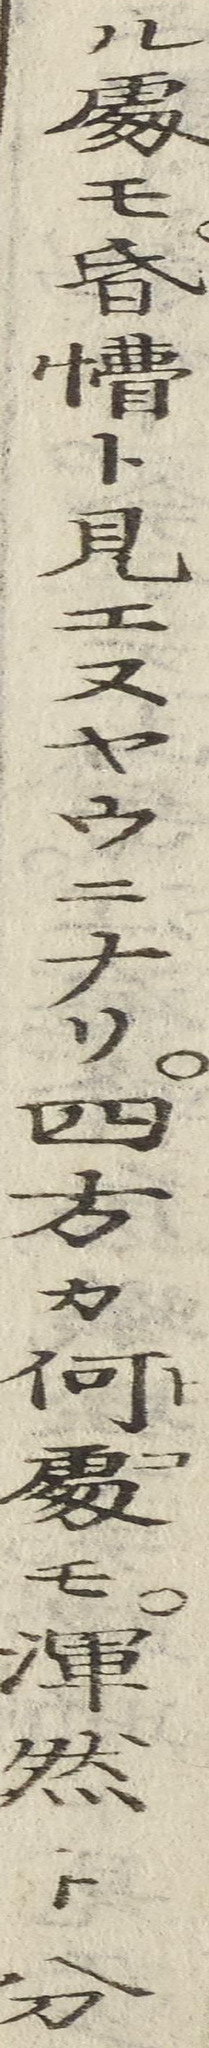ル処モ。昏懵ト見エヌヤウニナリ。四方カ何処モ。渾然ト分
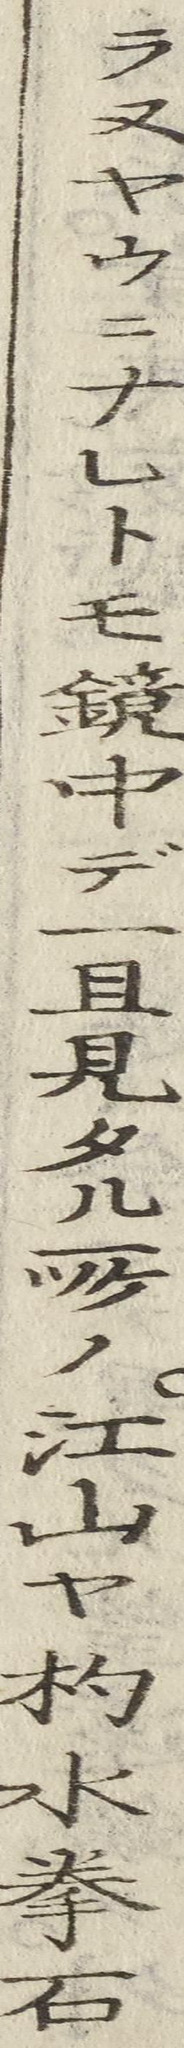ラヌヤウニナレトモ。鏡中デ一且見タル所ノ。江山ヤ杓水拳石
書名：護法新論　上
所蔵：東京大学地震研究所図書室 Earthquake Research Institute Library, The University of Tokyo, JAPAN
